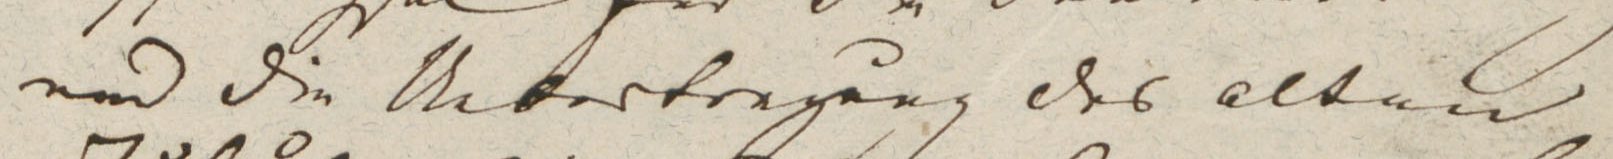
und die Uebertragung des alten
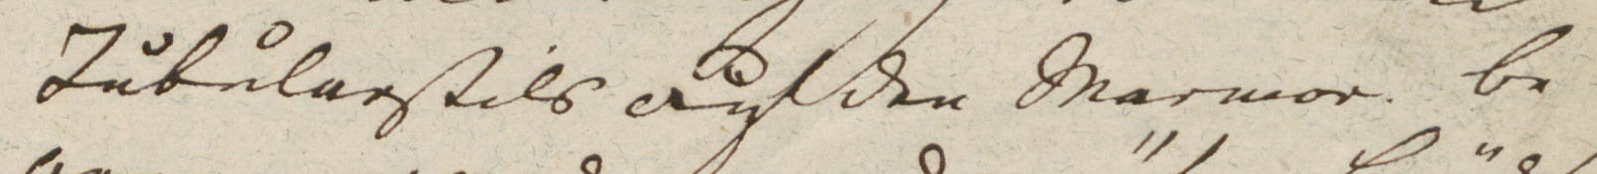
Tubularstils auf den Marmor be-
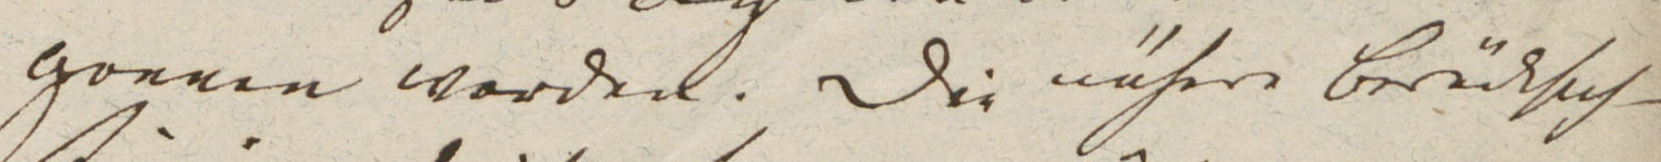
gonnen worden. Die nähere Berücksich-
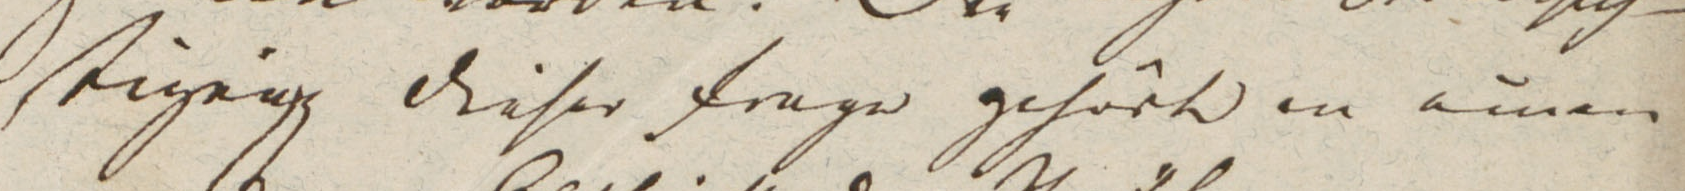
tigung dieser Frage gehört in einen
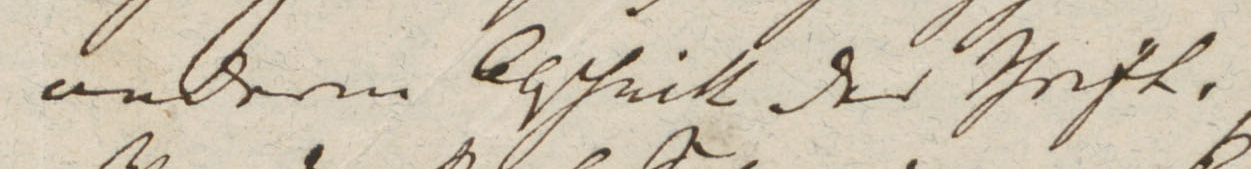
anderen Abschnitt der Schrift.
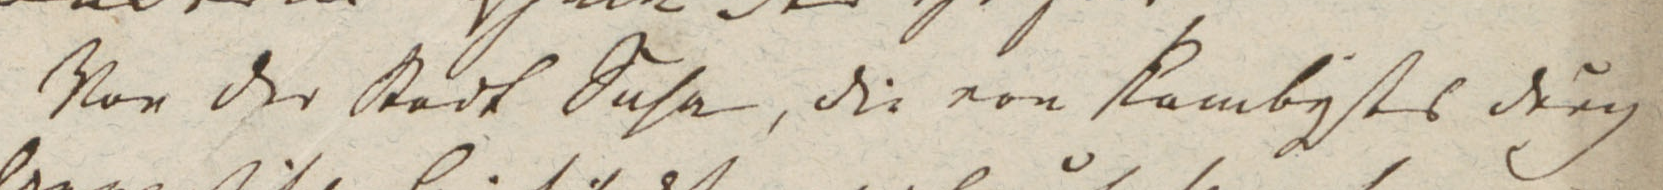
Von der Stadt Susa, die von Kambyses durch
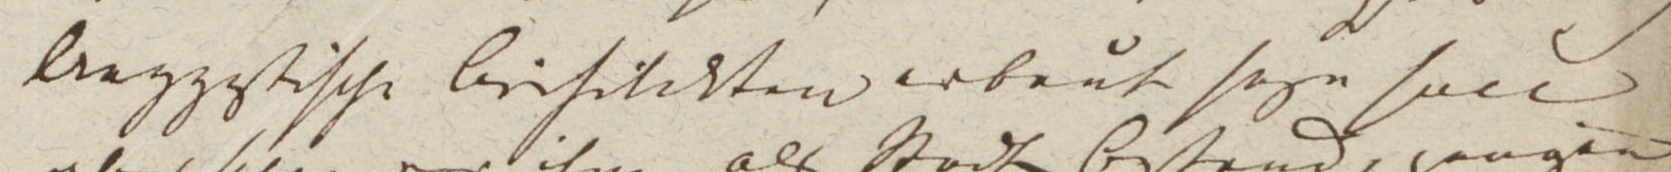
Aegyptische Architekten erbaut seyn soll
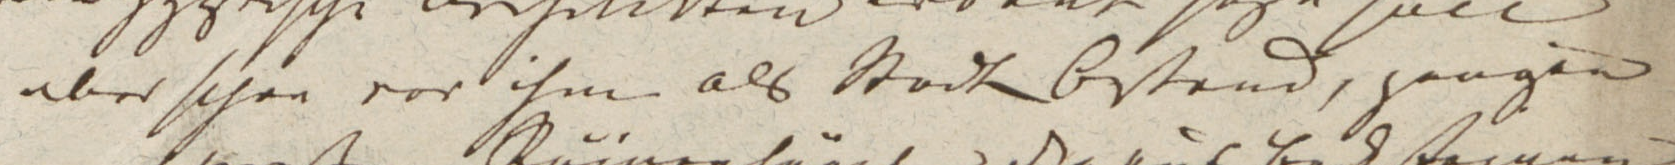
aber schon vor ihm als Stadt bestand, zeugen
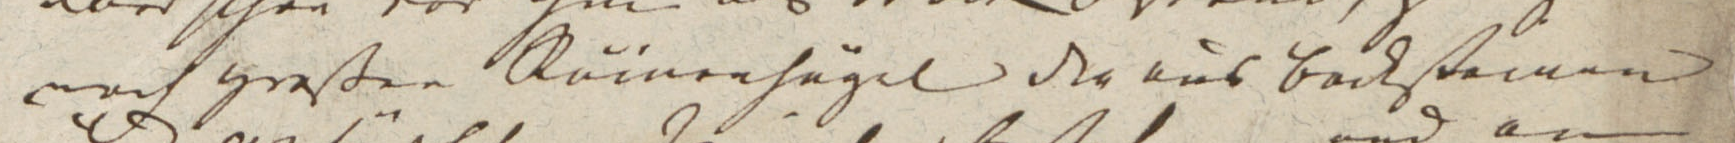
noch grossen Ruinenhügel die aus Backsteinen
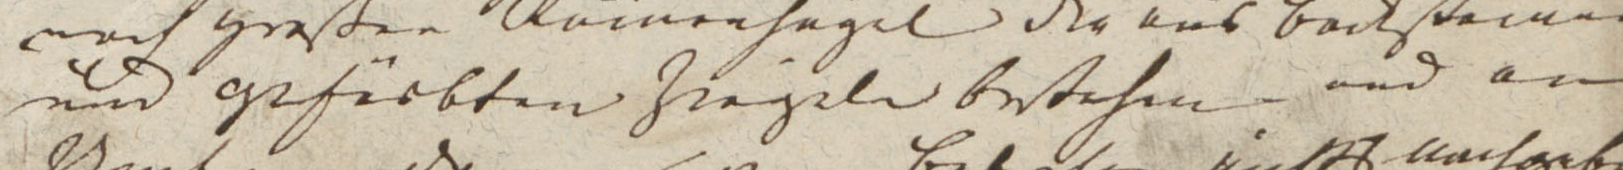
und gefärbten Ziegeln bestehen und an
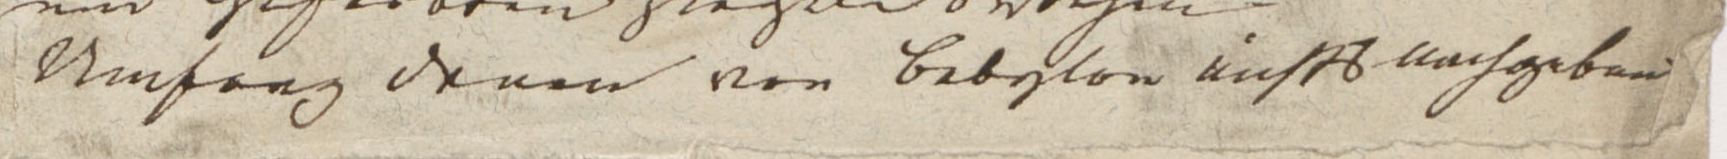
Umfang denen von Babylon nichts nachgeben
